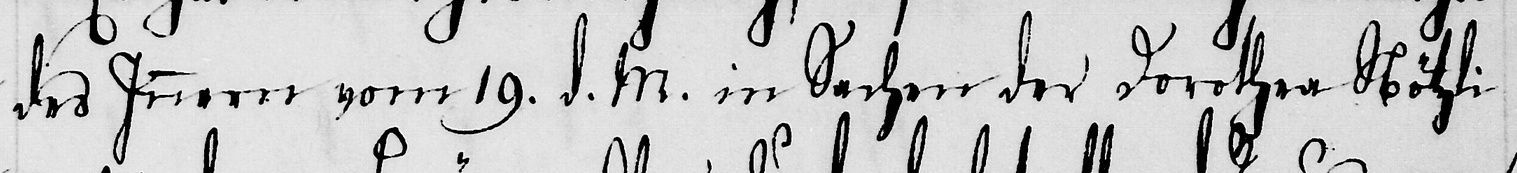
des Innern vom 19. d. M. in Sachen der Dorothea Nötzli
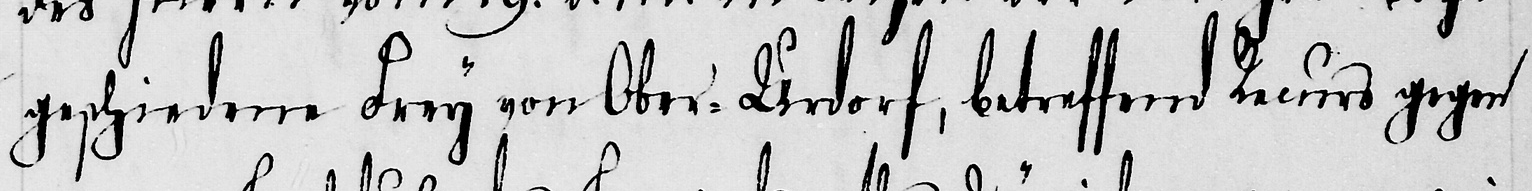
geschiedene Frey von Ober-Urdorf, betreffend Recurs gegen
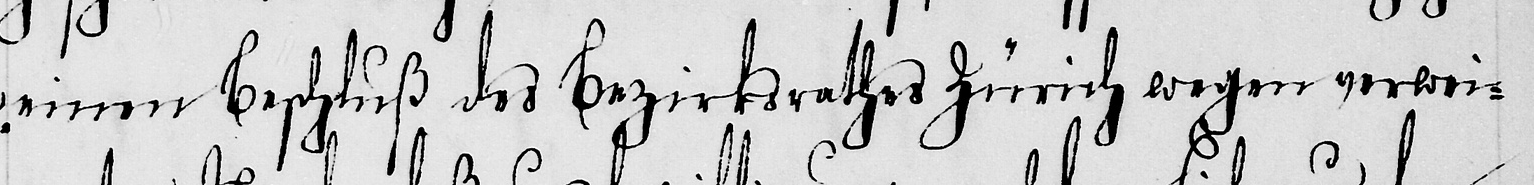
einen Beschluß des Bezirksrathes Zürich wegen verwei¬
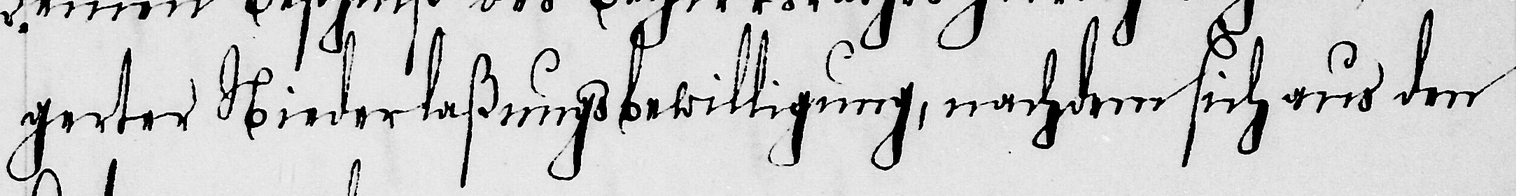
gerter Niederlaßungsbewilligung, nachdem sich aus den
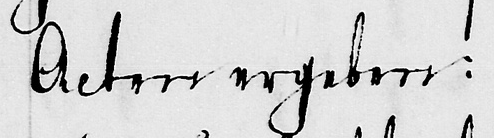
Acten ergeben:
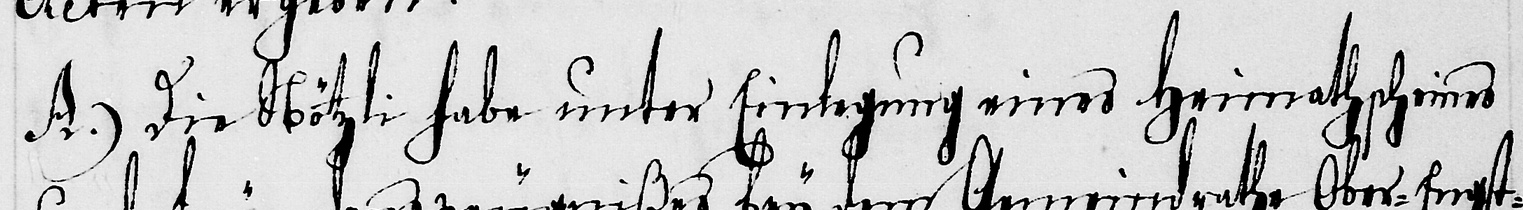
A.) Die Nötzli habe unter Einlegung eines Heimathscheines
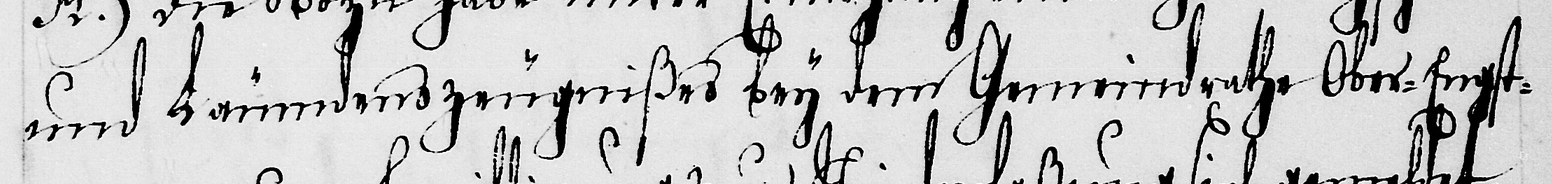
und Läumdenszeugnißes bey dem Gemeindrathe Ober-Engst¬
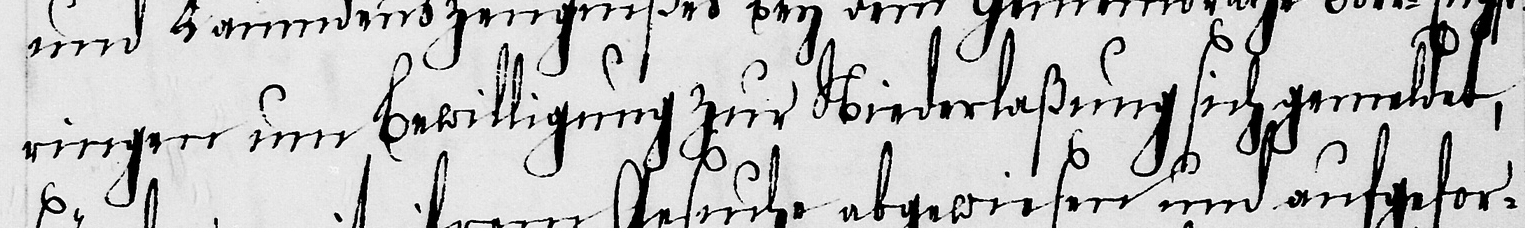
ringen um Bewilligung zur Niederlaßung sich gemeldet,
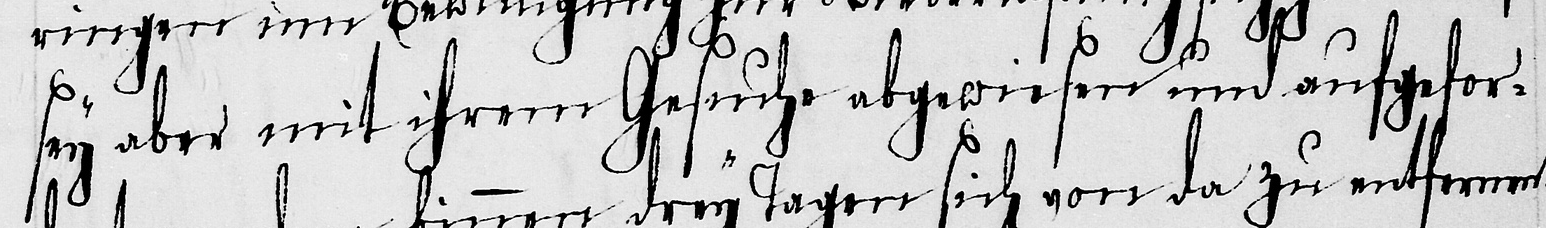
sey aber mit ihrem Gesuche abgewiesen und aufgefor¬
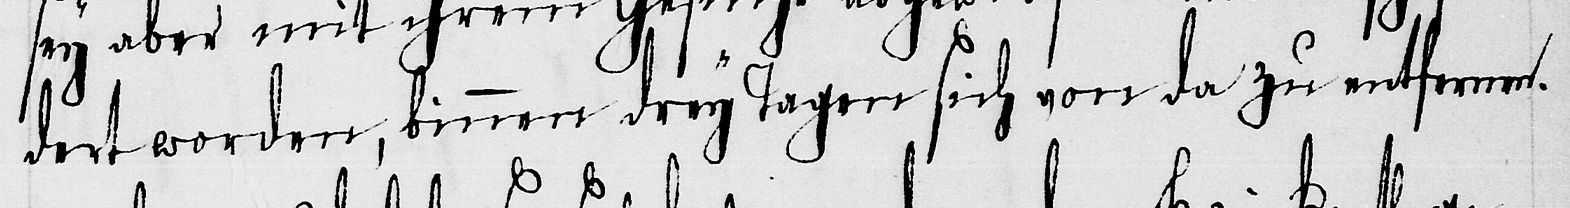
dert worden, binnen drey Tagen sich von da zu entfernen.
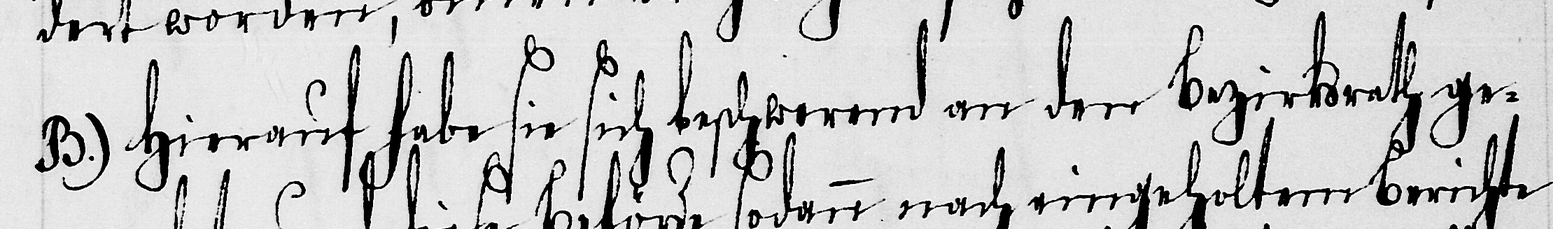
B.) Hierauf habe sie sich beschwerend an den Bezirksrath ge¬
